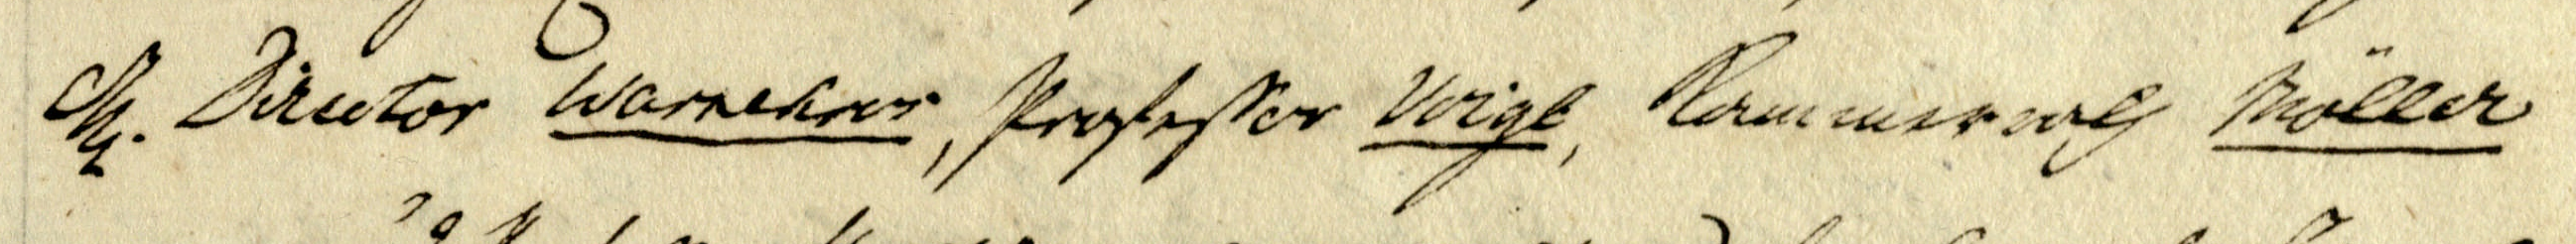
dh. Director Warnekros, Professor Voigt, Kammerrath Möller
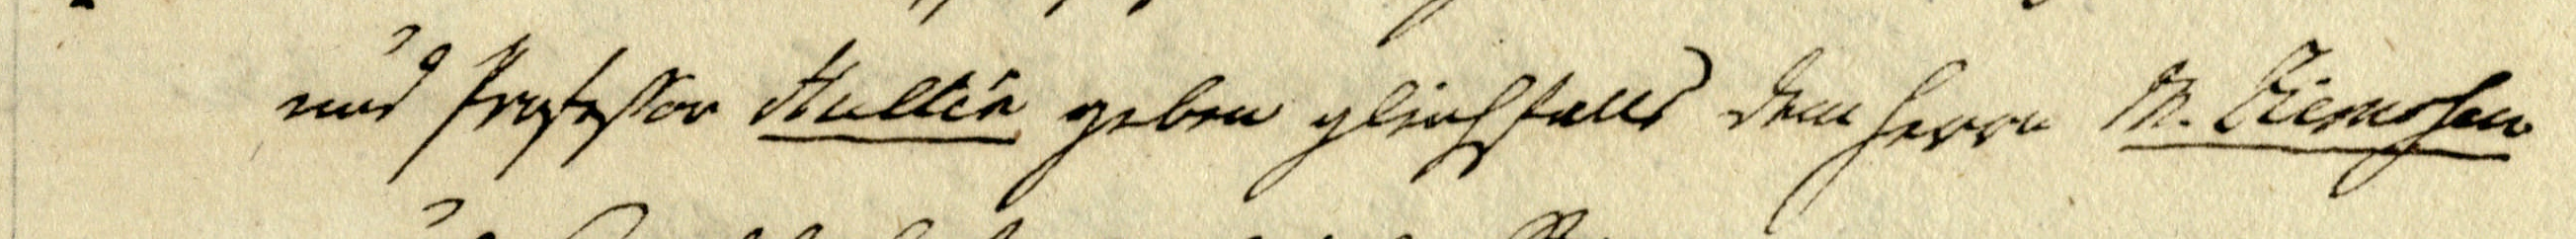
und Professor Hultèn geben gleichfalls dem herrn M. Ziemssen
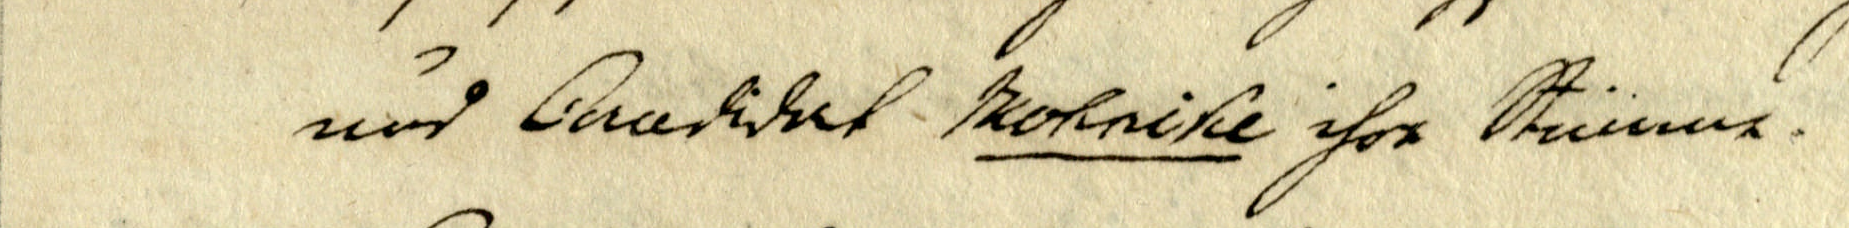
und Candidat Mohnike ihre Stimme.
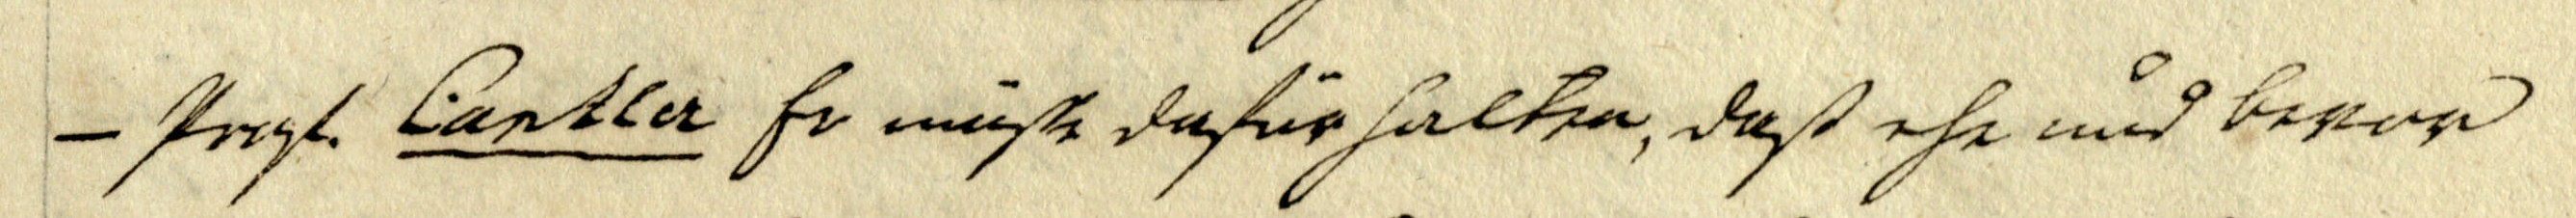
Prof. Canzler Er müsse dafür halten, daß ehe und bevor
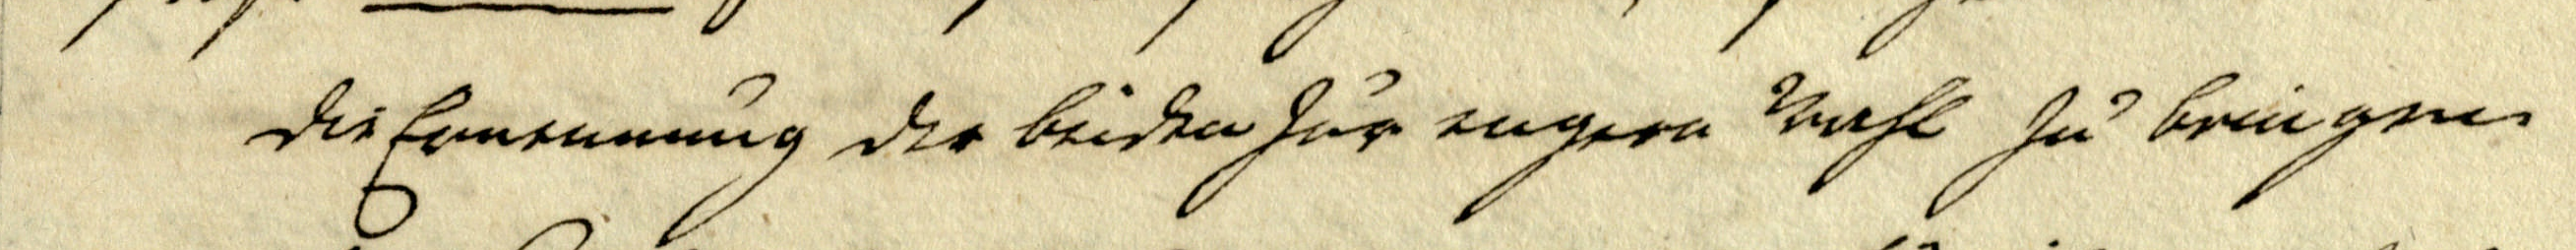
die Ernennung der beiden zur engern Wahl zu bringen
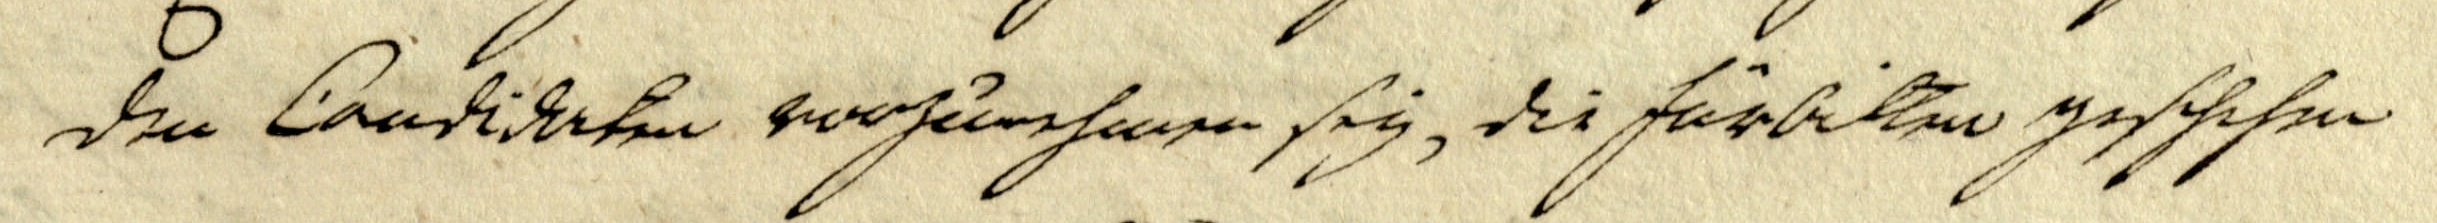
den Candidaten vorzunehmen seÿ, die Fürbitten geschehen
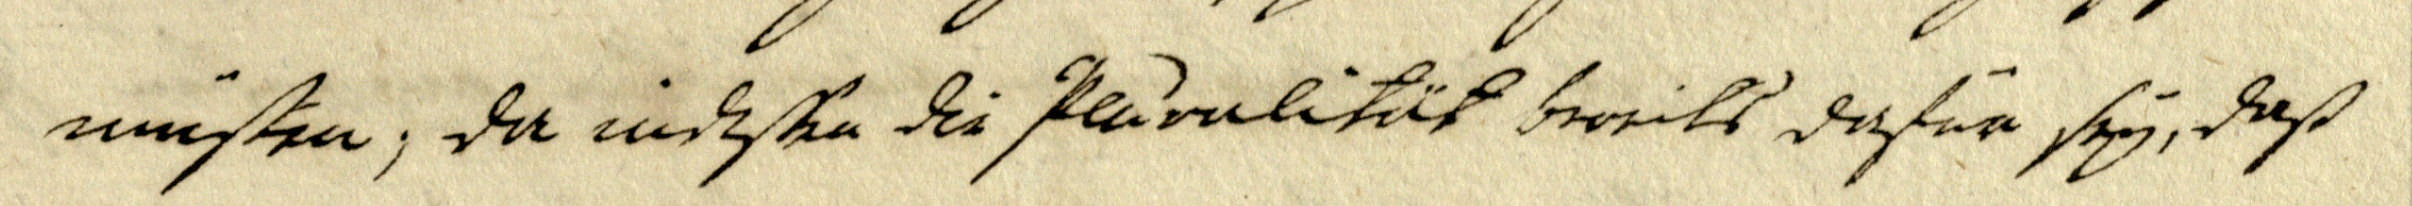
müsten, da indessen die Pluralität bereits dafür seÿ, daß
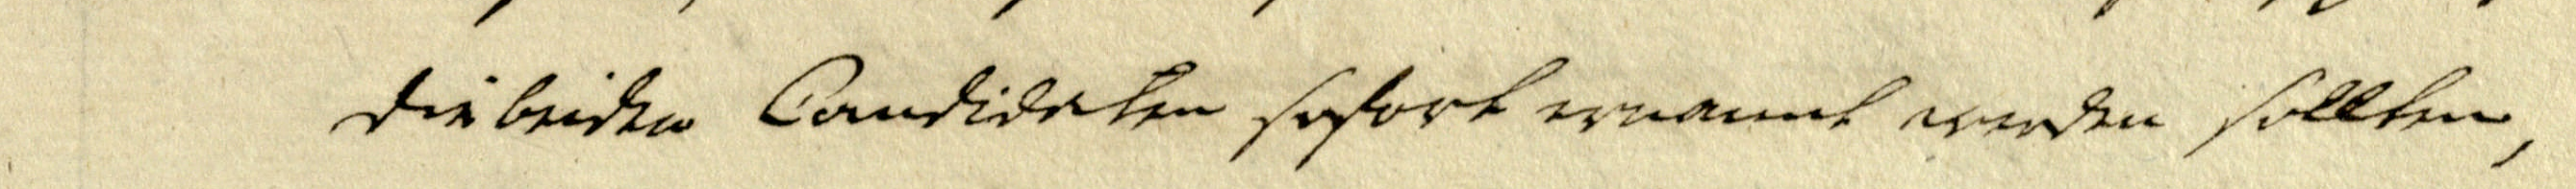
die beiden Candidaten sofort ernannt werden sollten,
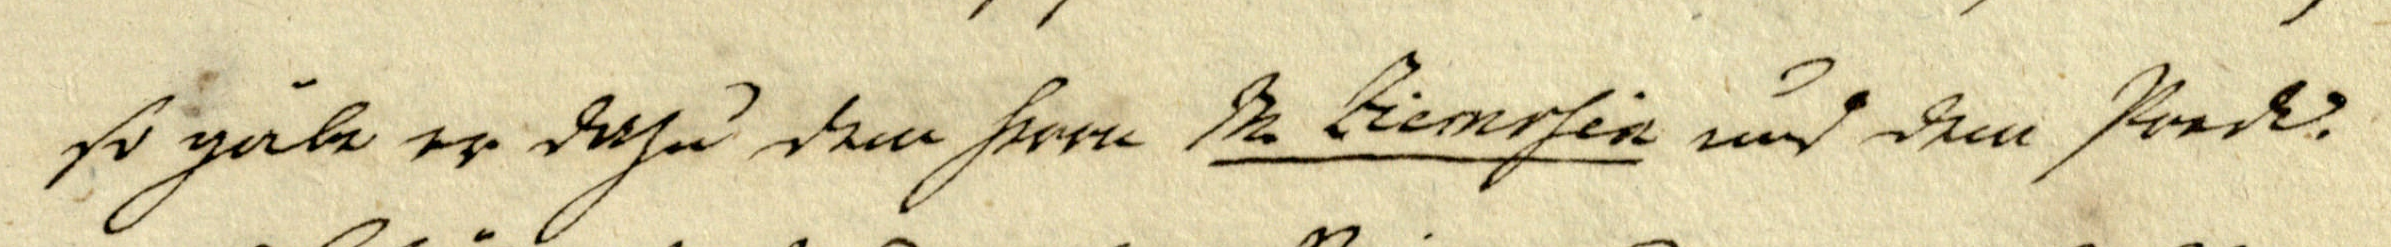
so gäbe er dazu dem herrn M. Ziemssen und dem Predi¬
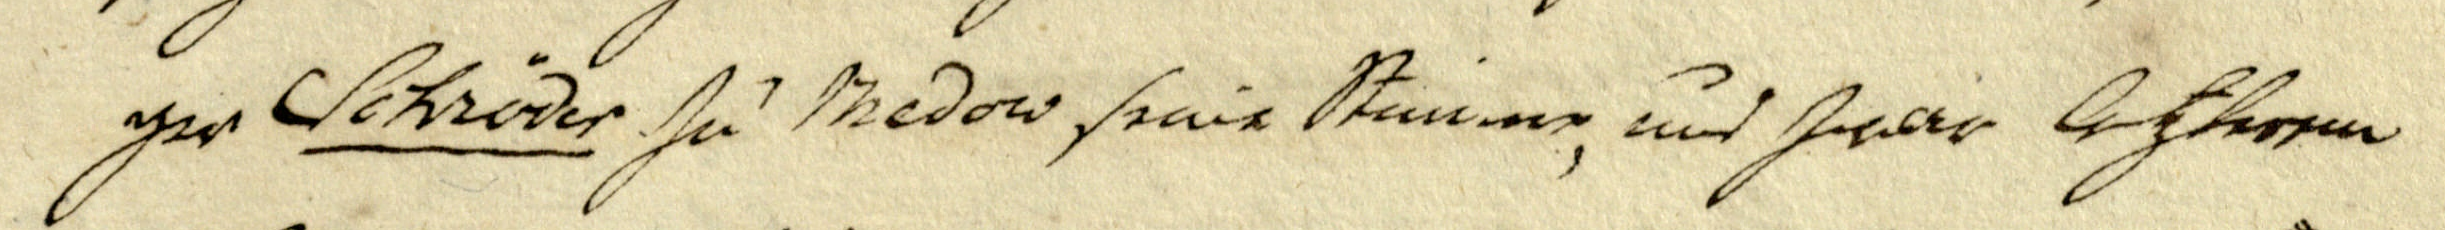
ger Schröder zu Medow seine Stimme, und zwar letzterm
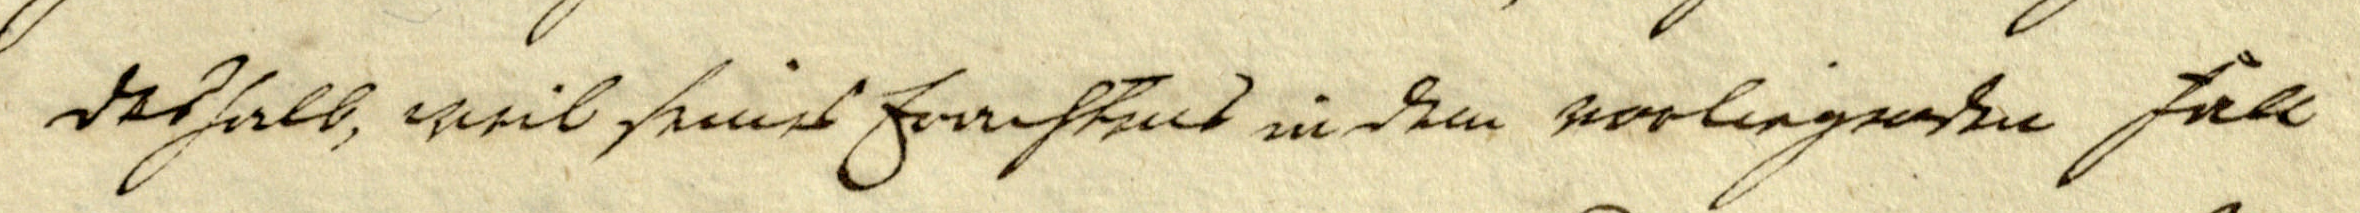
deshalb, weil seines Erachtens in dem vorliegenden Fall
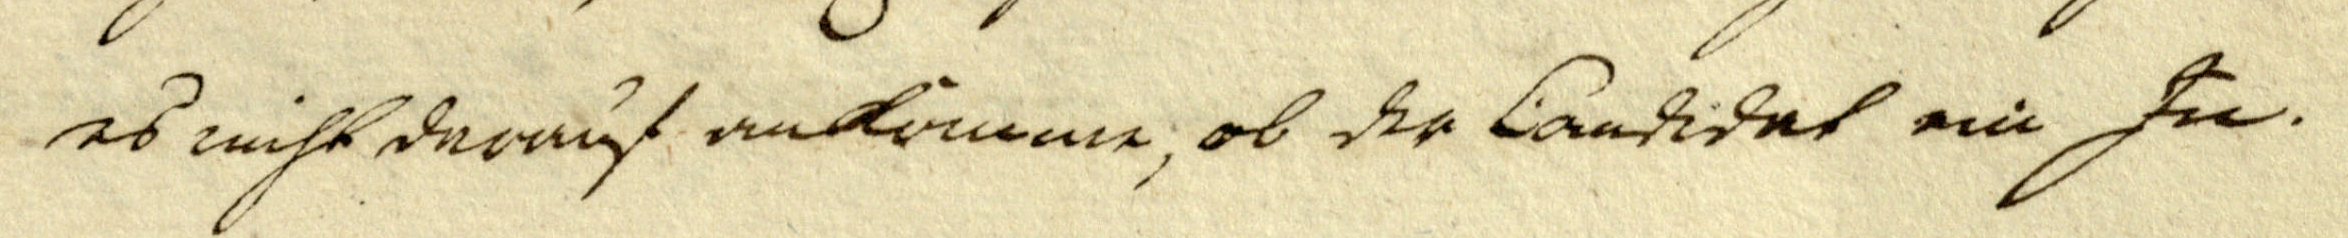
es nicht darauf ankomme, ob der Candidat ein In¬
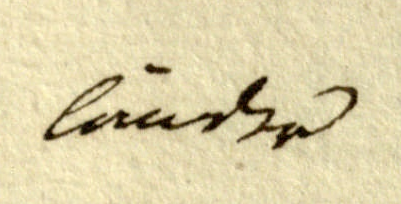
länder
